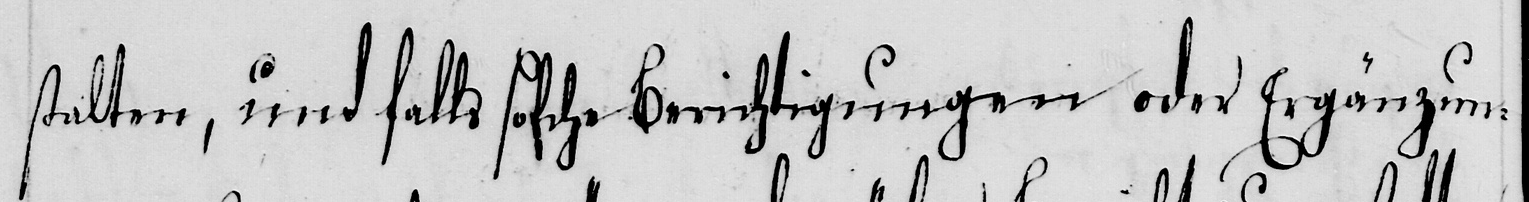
stalten, und falls solche Berichtigungen oder Ergänzun¬
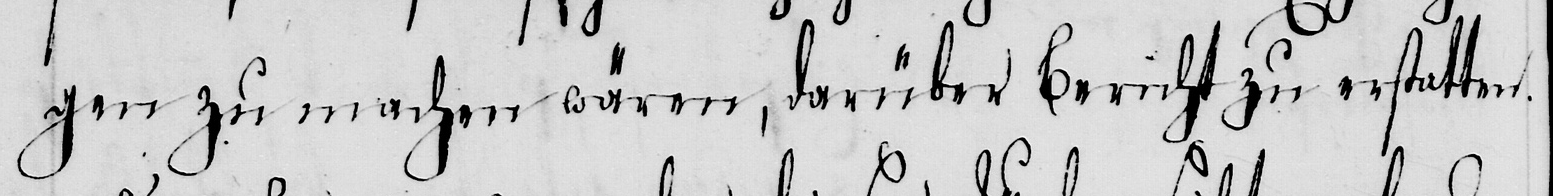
gen zu machen wären, darüber Bericht zu erstatten.
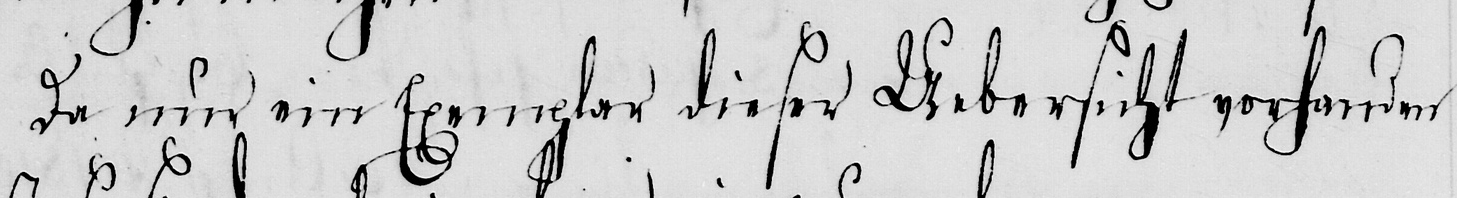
Da nur ein Exemplar dieser Uebersicht vorhanden
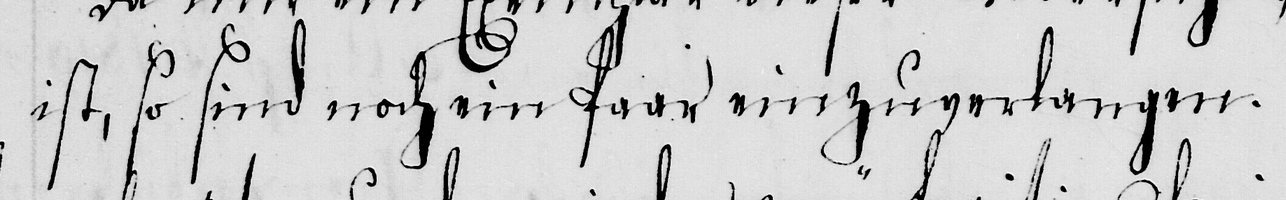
ist, so sind noch ein Paar einzuverlangen.
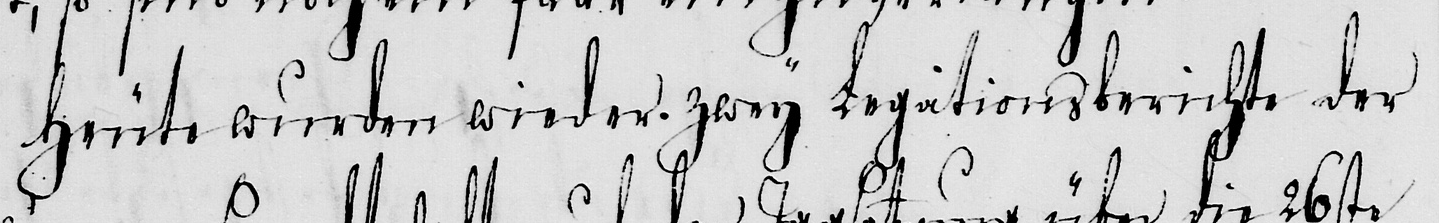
Heute wurden wieder zwey Legationsberichte der
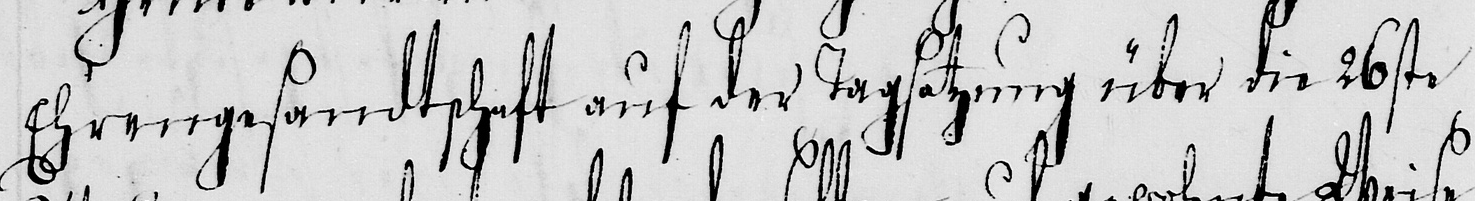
Ehrengesandtschaft auf der Tagsatzung über die 26ste
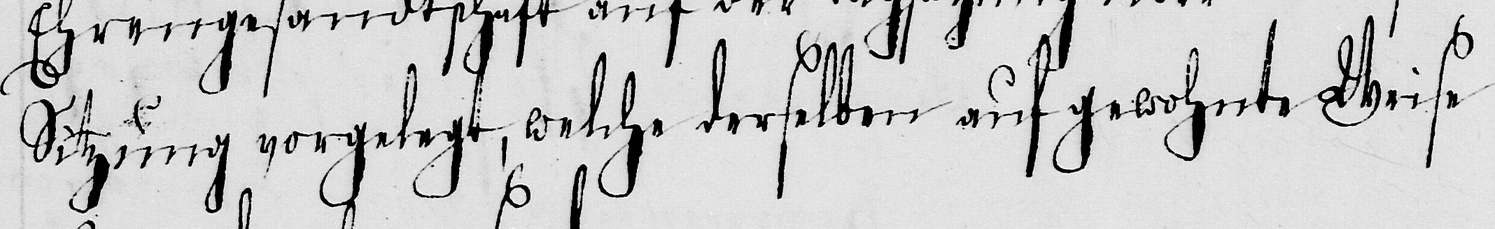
Sitzung vorgelegt, welche derselben auf gewohnte Weise
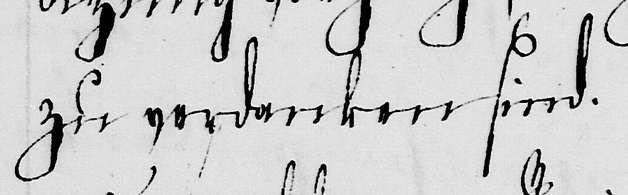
zu verdanken sind.
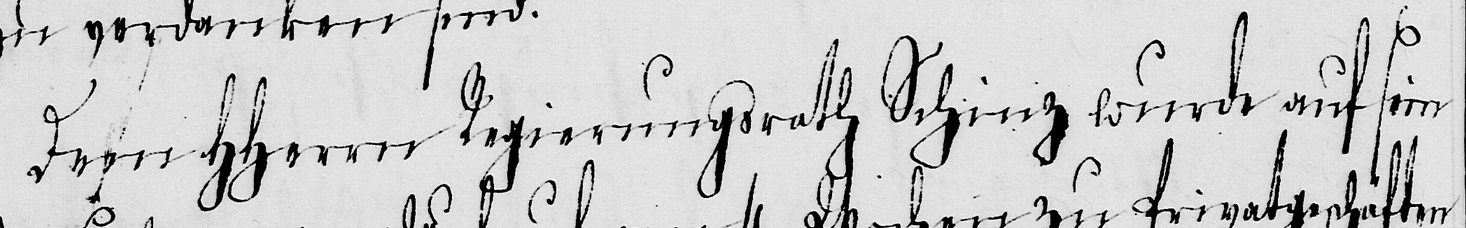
Dem HHerrn Regierungsrath Schinz wurde auf sein
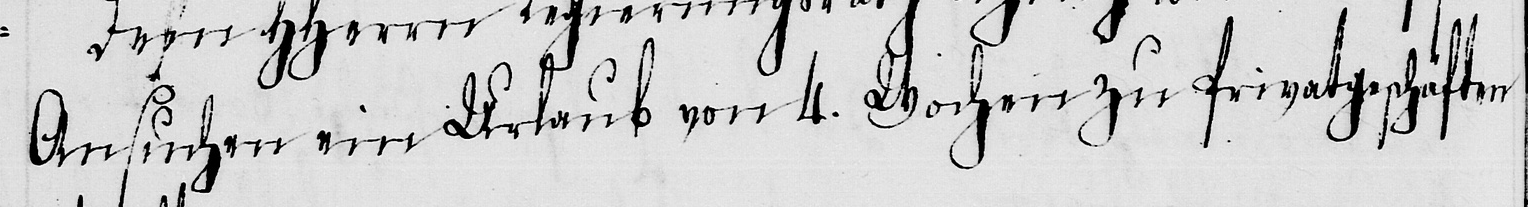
Ansuchen ein Urlaub von 4. Wochen zu Privatgeschäften
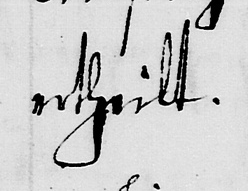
ertheilt.
